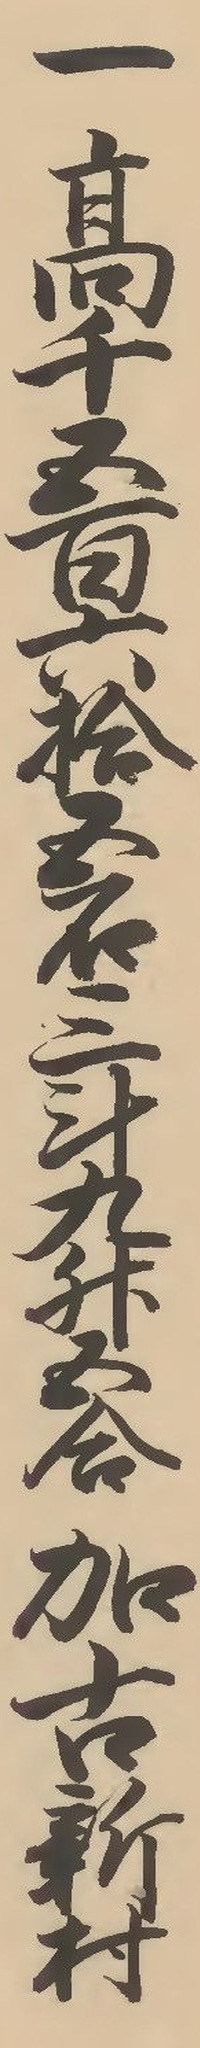一髙千五百六拾五石三斗九升五合加古新村
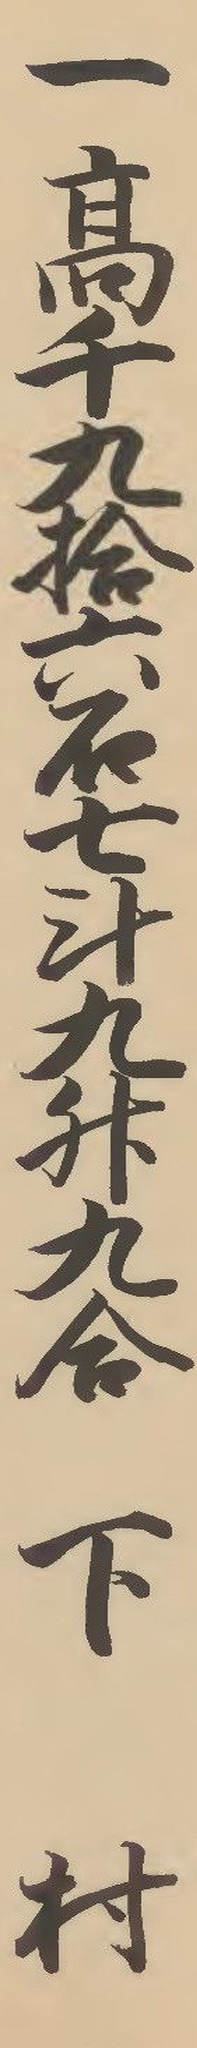一髙千九拾六石七斗九升九合下村
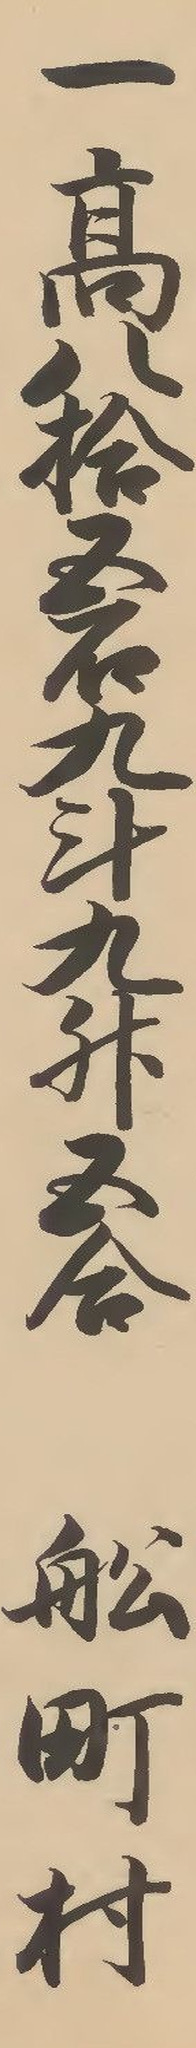一髙八拾五石九斗九升五合舩町村
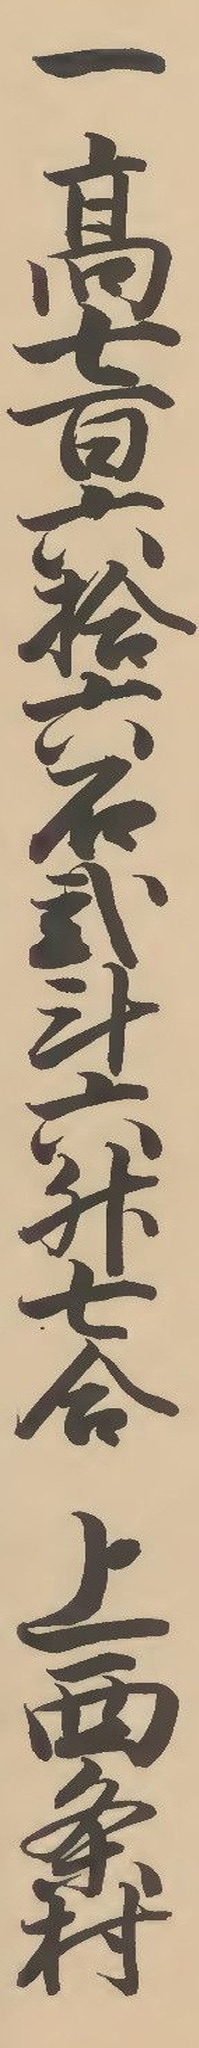一髙七百六拾六石弐斗六升七合上西条村
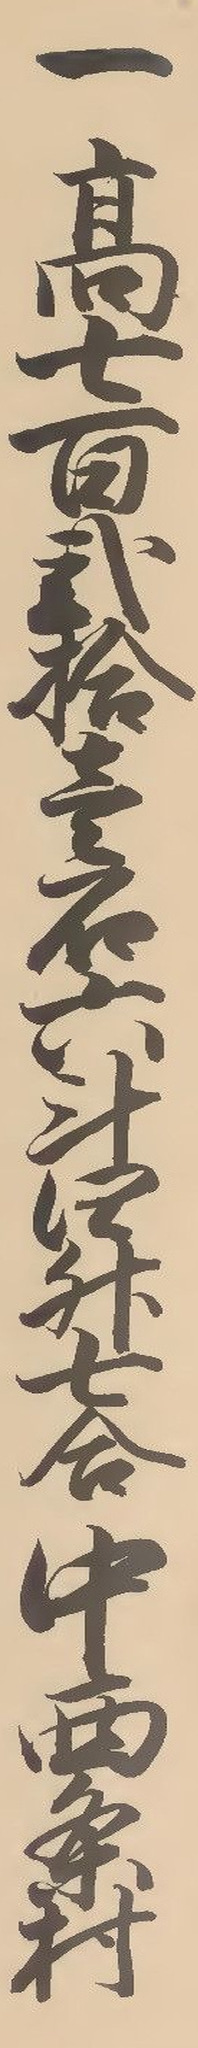一髙七百弐拾壱石六斗四升七合中西条村
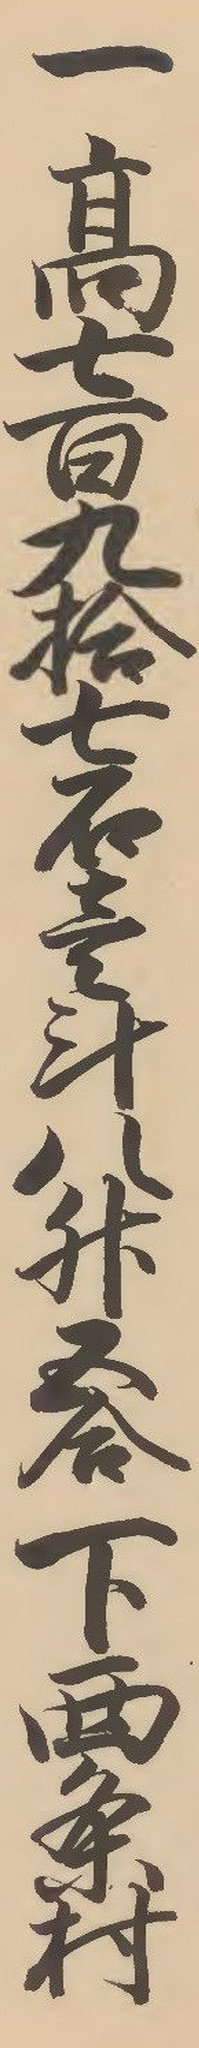一髙七百九拾七石壱斗八升五合下西条村
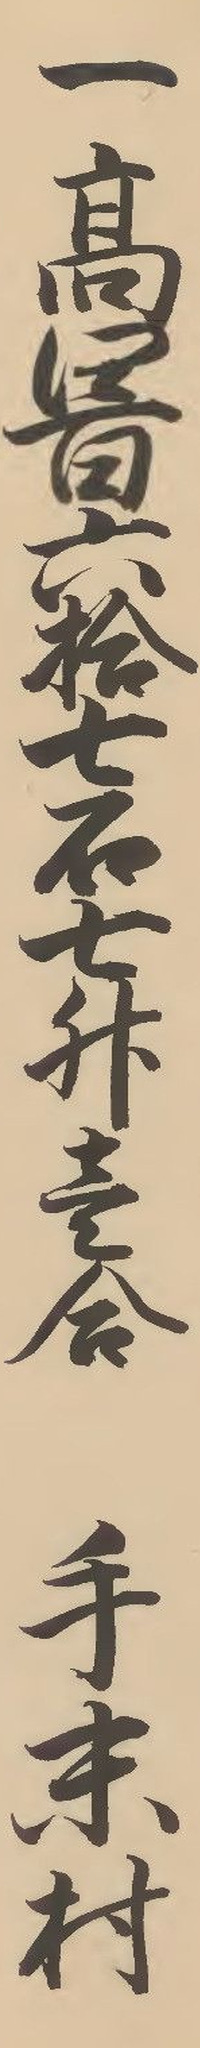一髙四百六拾七石七升壱合手末村
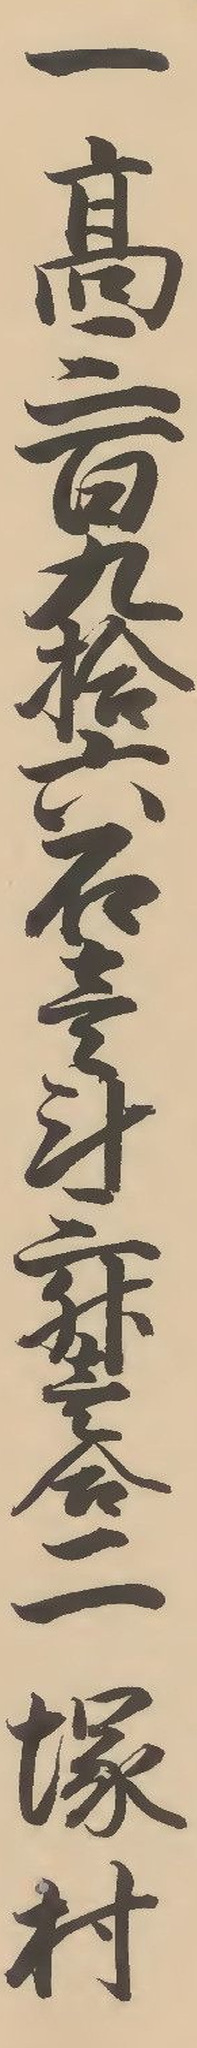一髙三百九拾六石壱斗弐升壱合二塚村

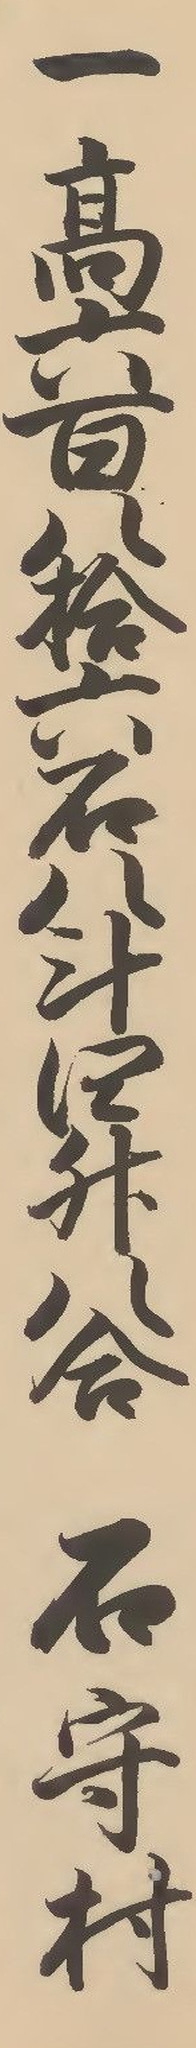一髙六百八拾六石八斗四升八合石守村
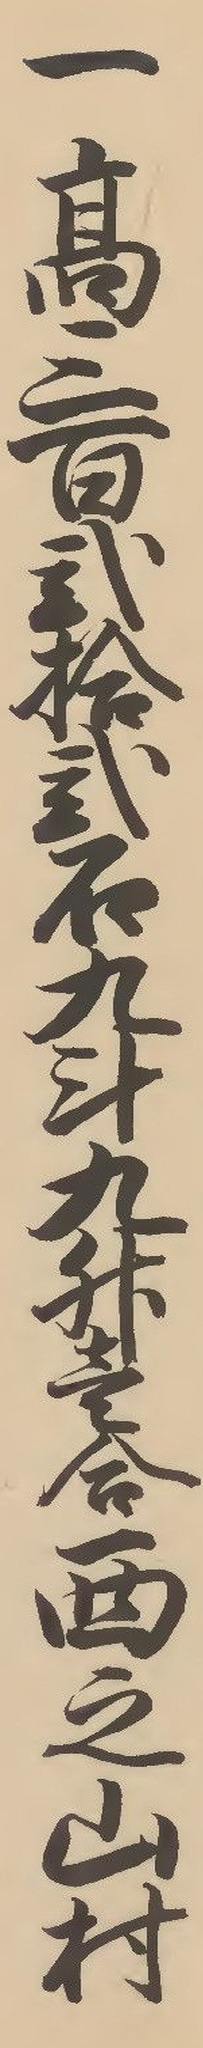一髙三百弐拾弐石九斗九升壱合西之山村
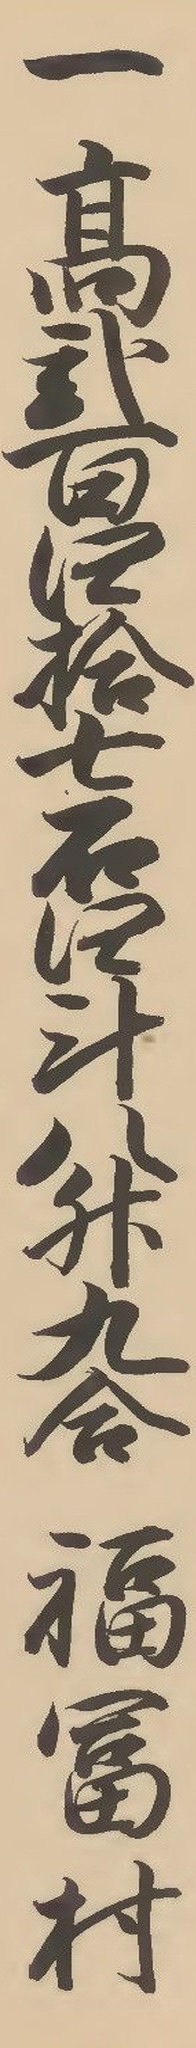一髙弐百四拾七石四斗八升九合福冨村
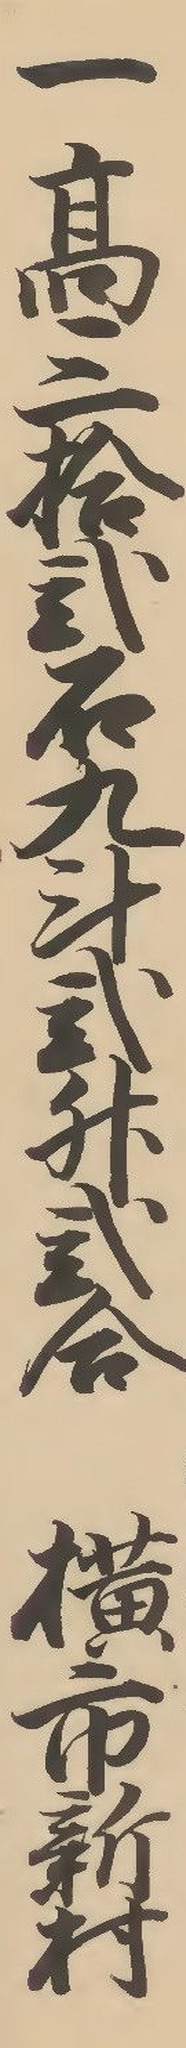一髙三拾弐石九斗弐升弐合横市新村
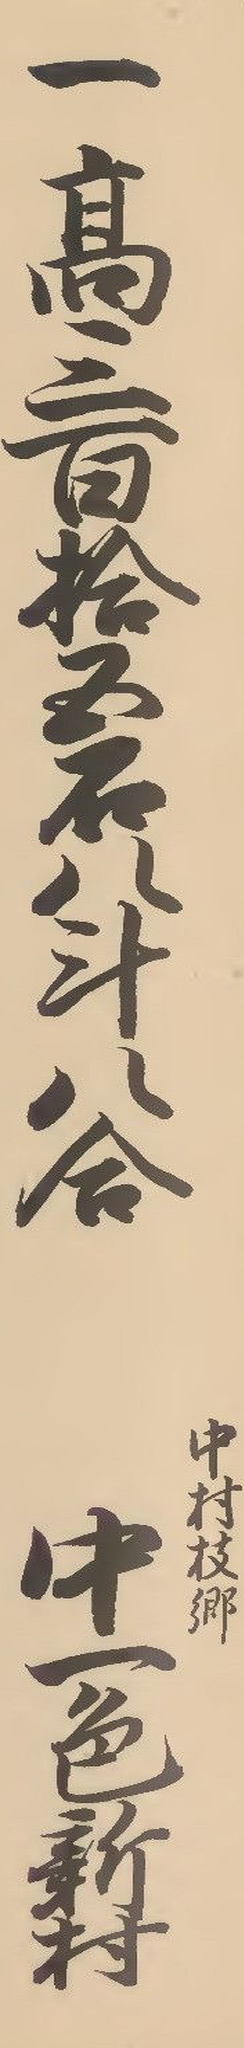一髙三百拾五石八斗八合中一色新村
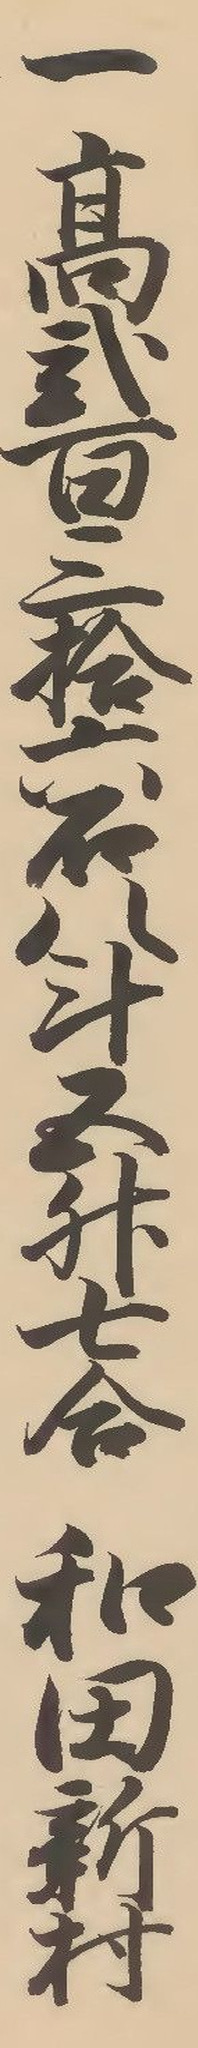一髙弐百三拾六石八斗五升七合和田新村
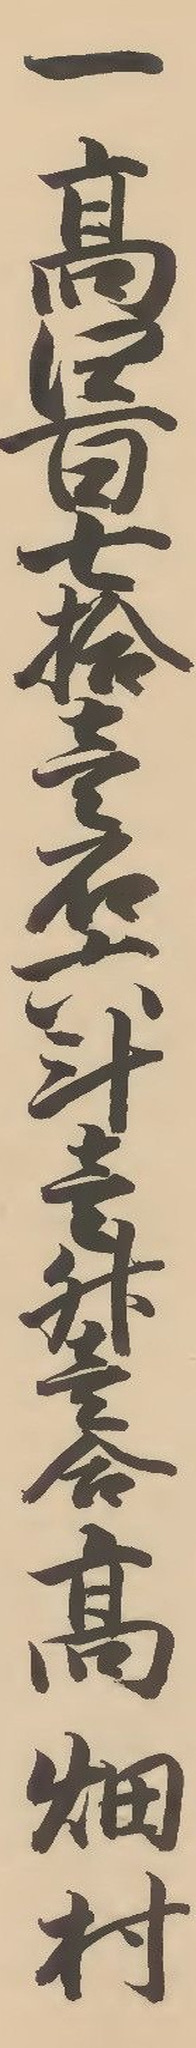一髙四百七拾壱石六斗壱升壱合髙畑村
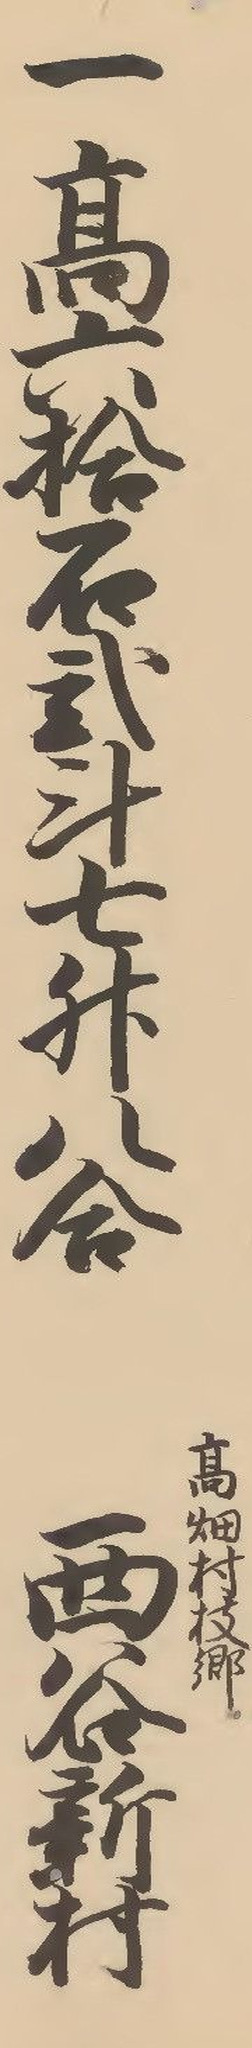一髙六拾石弐斗七升八合西谷新村
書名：播磨国郷帳
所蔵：国立公文書館 National Archives of Japan
